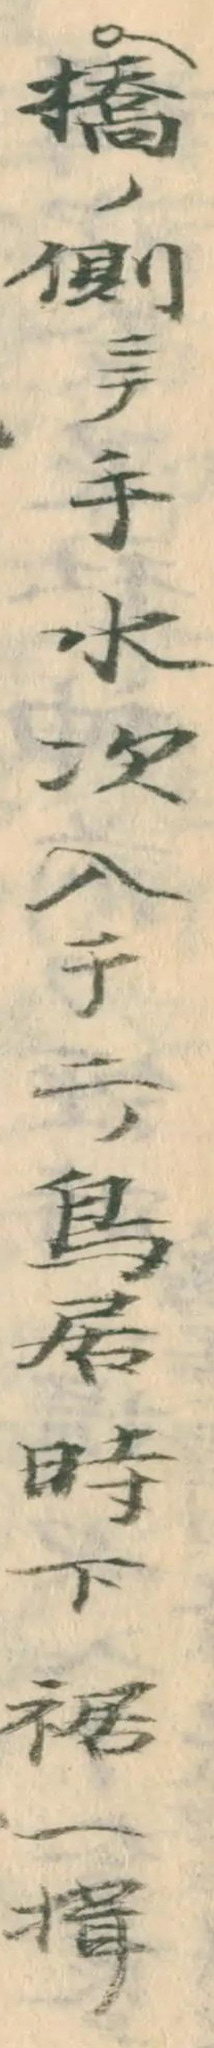◦橋ノ側ニテ手水次入于二ノ鳥居時下裾一揖
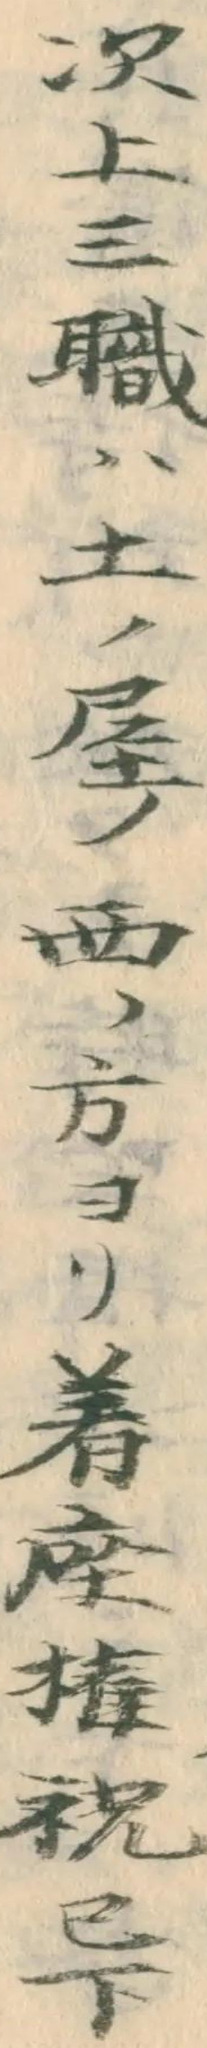次上三職ハ土ノ屋ノ西ノ方ヨリ着座権祝已下
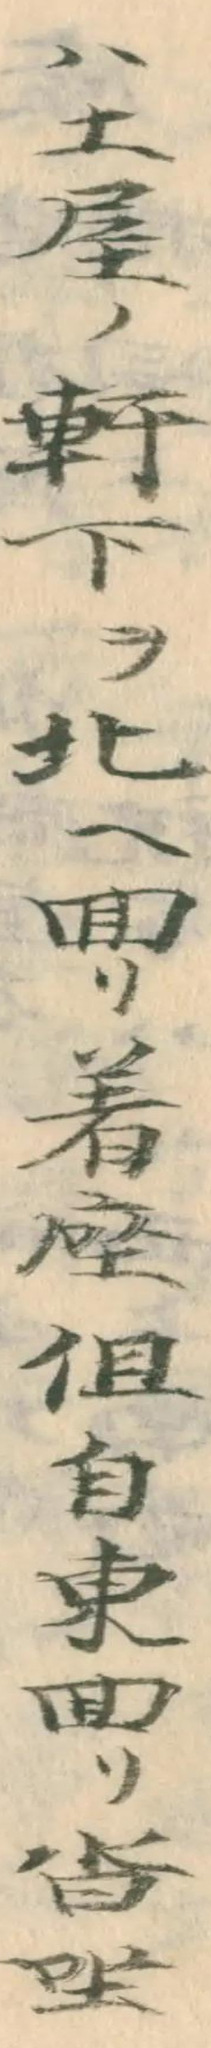ハ土屋ノ軒下ヲ北へ回リ着座但自東回リ沓座
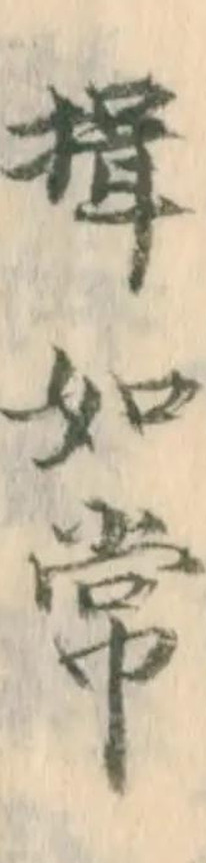揖如常
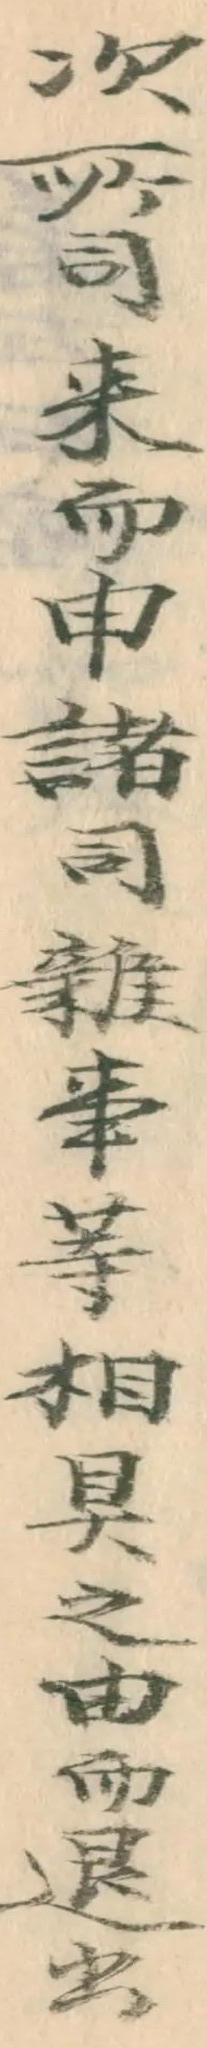次所司来而申諸司雑事等相具之由而退出
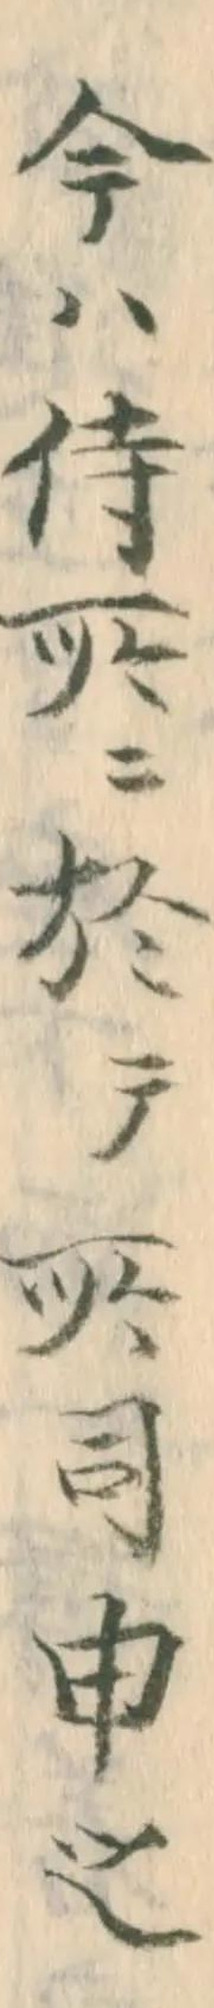今ハ侍所ニ於テ所司申之
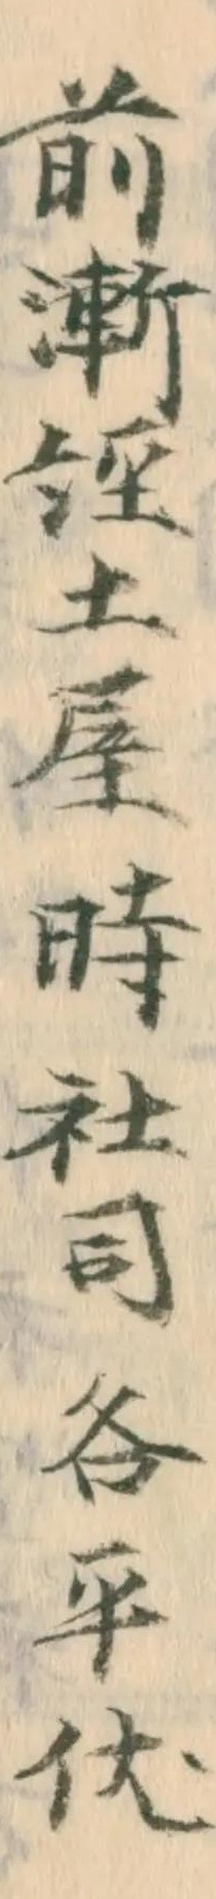前漸経土屋時社司各平伏
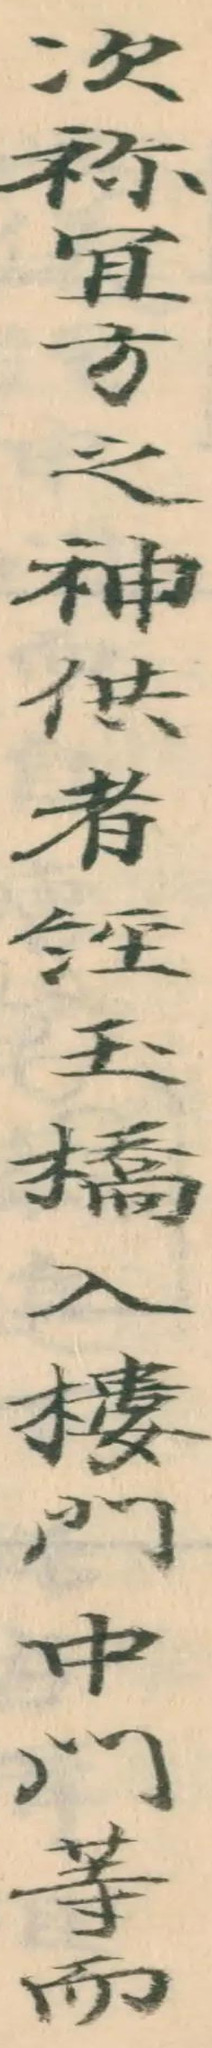次禰宜方之神供者経玉橋入楼門中門等而
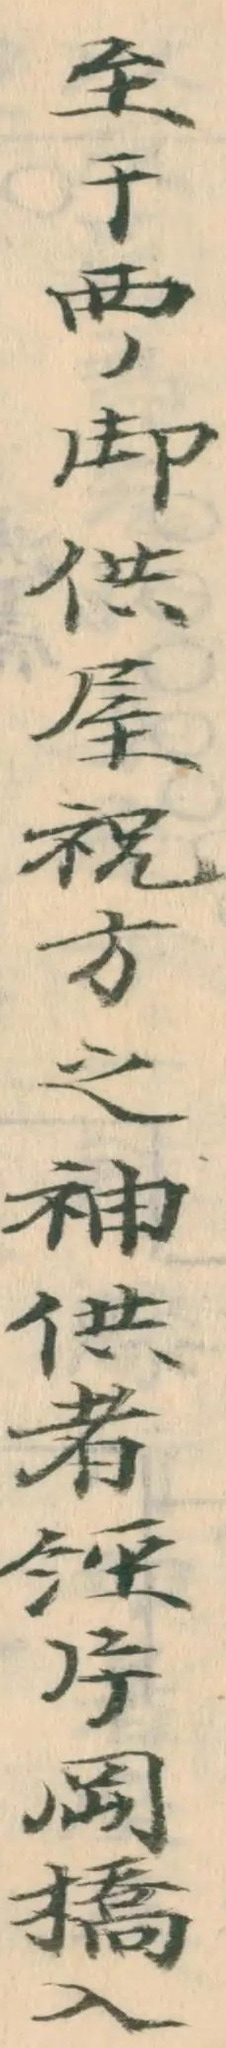至于西ノ御供屋祝方之神供者経片岡橋入
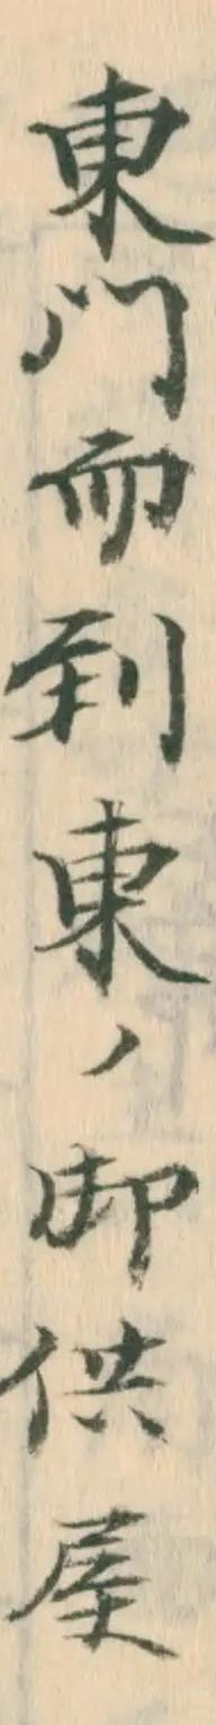東門而到東ノ御供屋
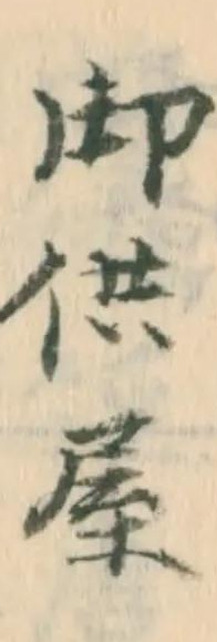御供屋
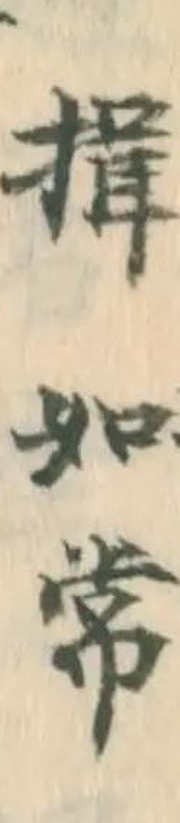揖如常
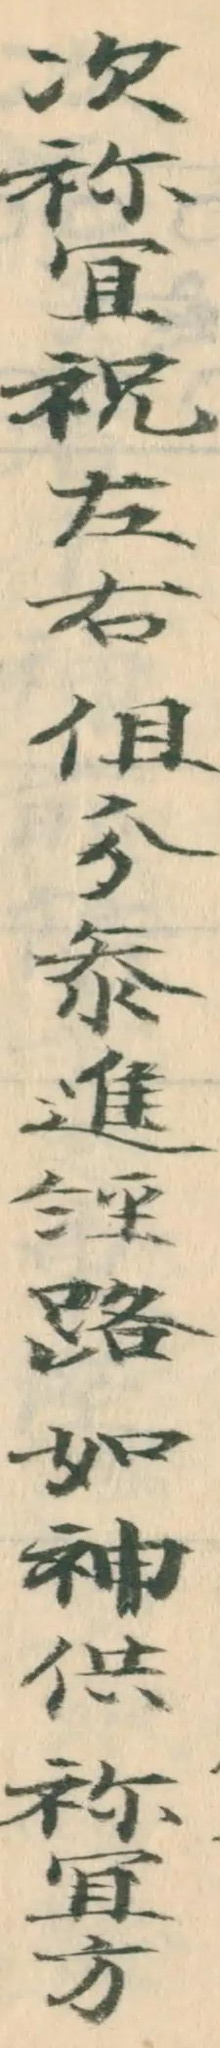次禰宜祝左右但分参進経路如神供禰宜方
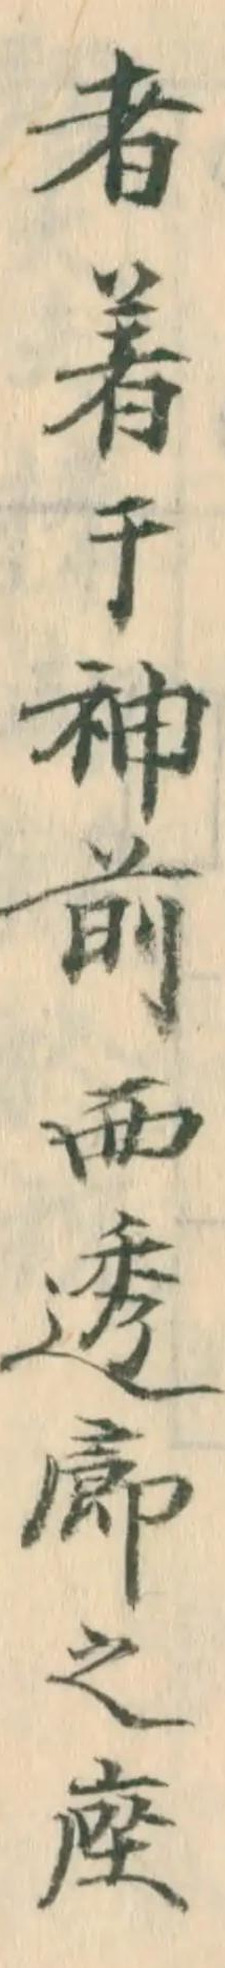者着于神前西透廊之座

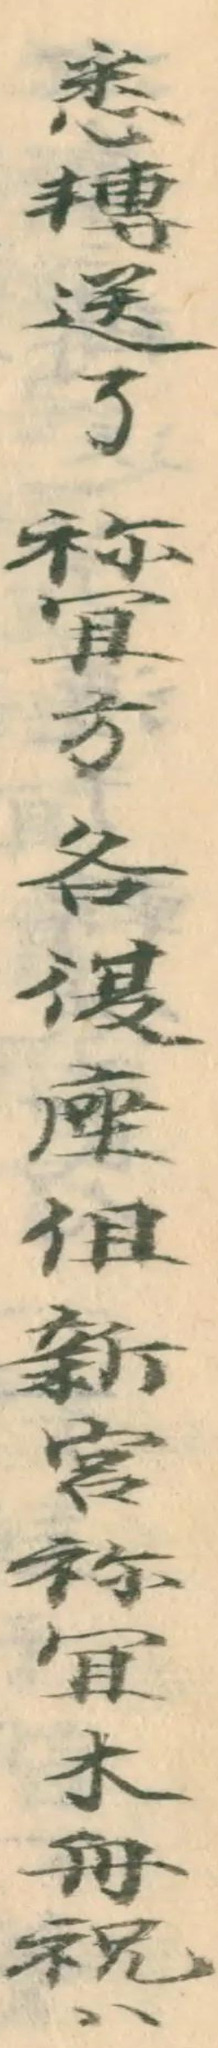悉転送了禰宜方各復座但新宮禰宜木舟祝ハ
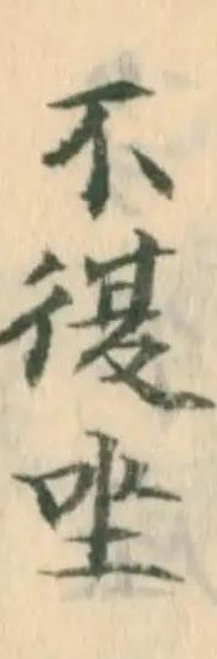不復坐
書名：賀茂社記録. 第5冊
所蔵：国立国会図書館 National Diet Library, JAPAN
